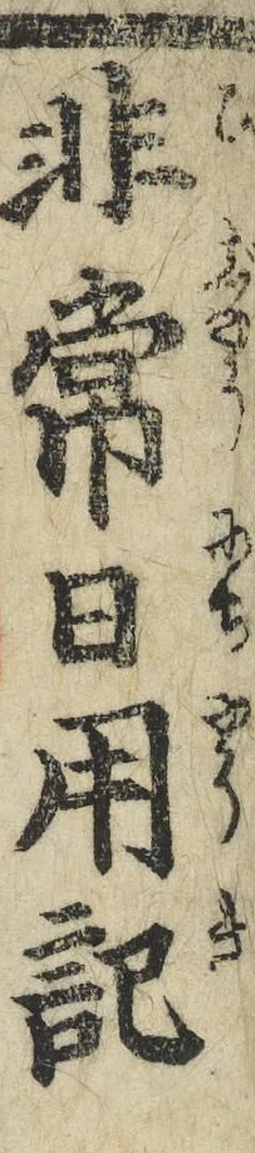非常日用記
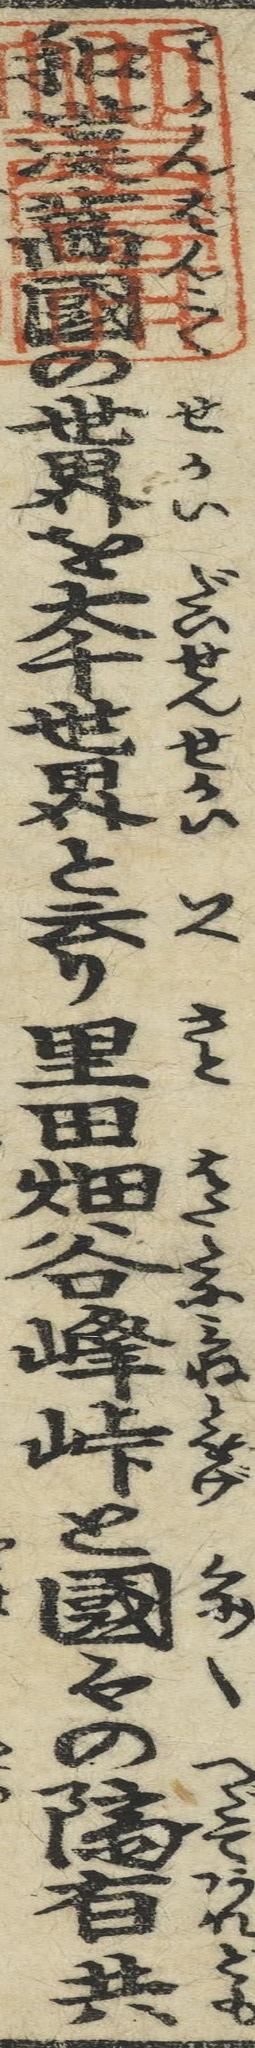和漢萬國の世界を大千世界と云り里田畑はた谷峰峠と国々の隔有共
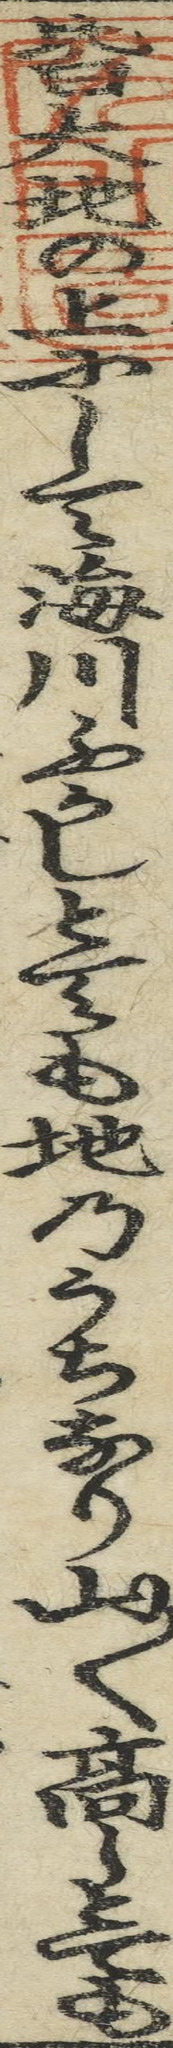皆大地の上にして海川ふかしとても地のうちなり山〳〵高しとても
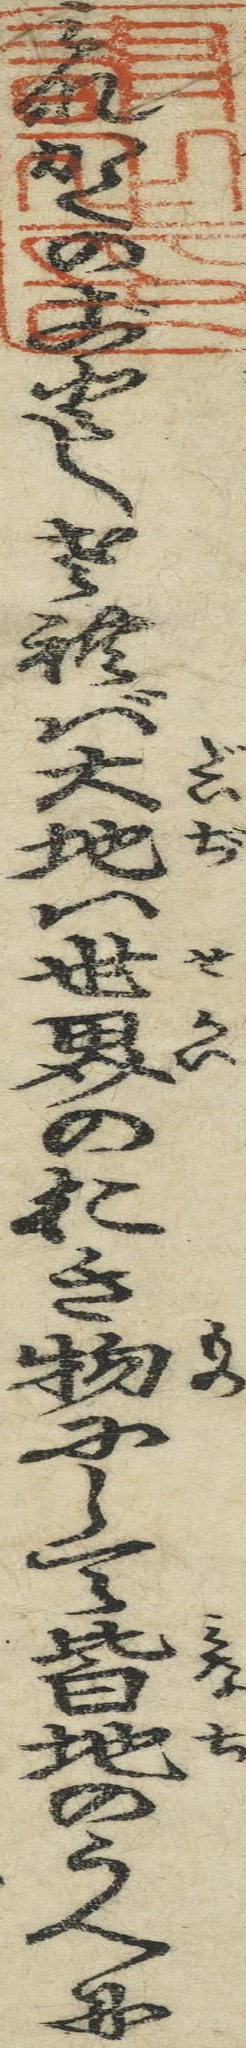みなかくのごとしされば大地は世界のおき物にして皆地のうへに
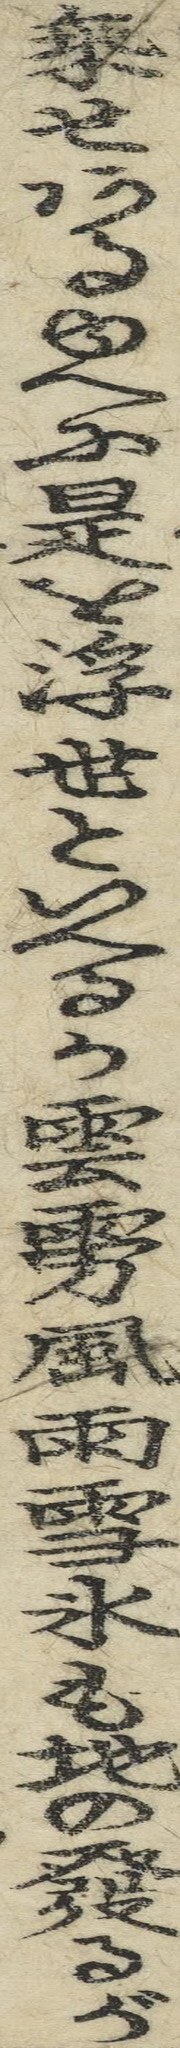乗せあるゆへに是を浮世といへるか雲霧風雨雪氷も地の發るが
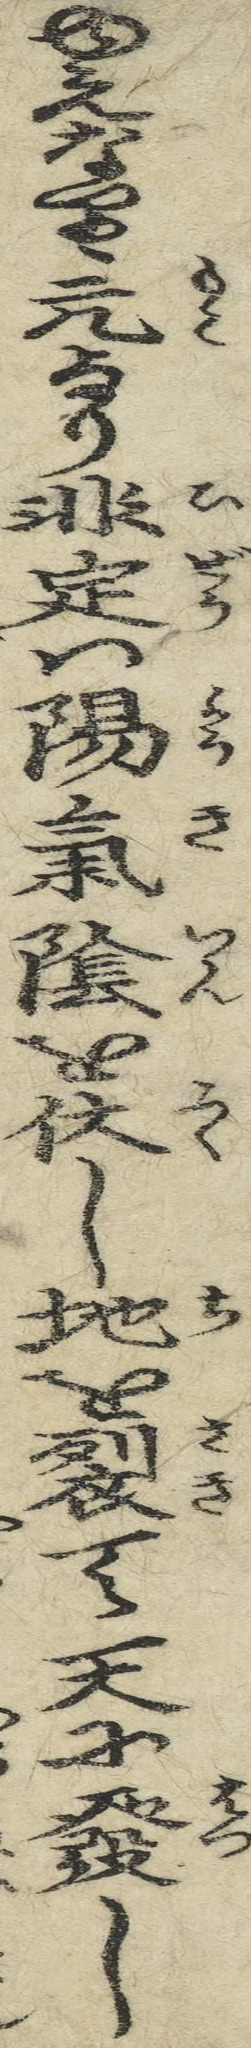ゆえなり元より非定は陽氣隂󠄁を伏し地を裂て天に發し
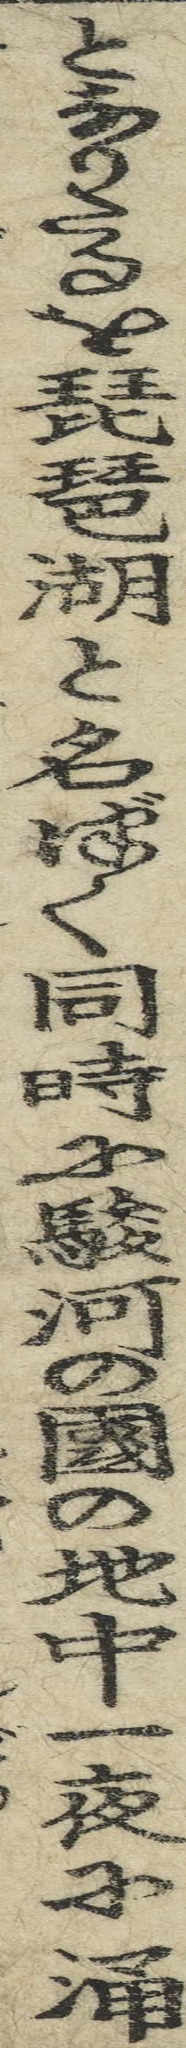となりたるを琵琶湖と名づく同時に駿河の國の地中一夜に涌
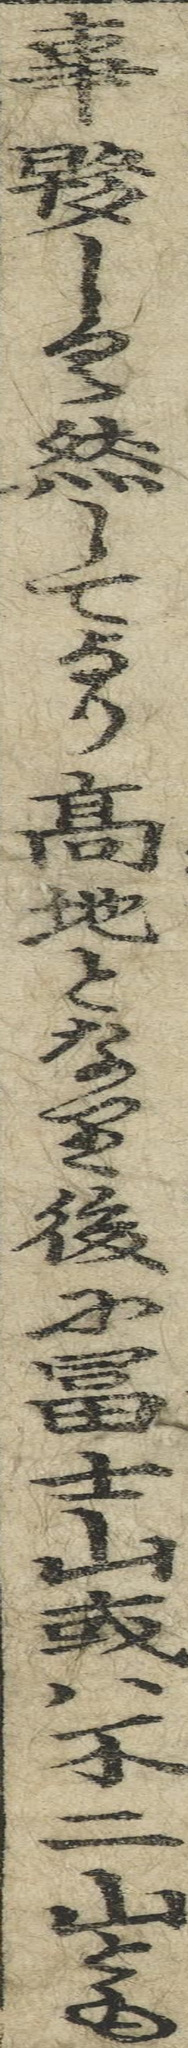事夥しく然してより高地となり後に冨士山或は不二山とも

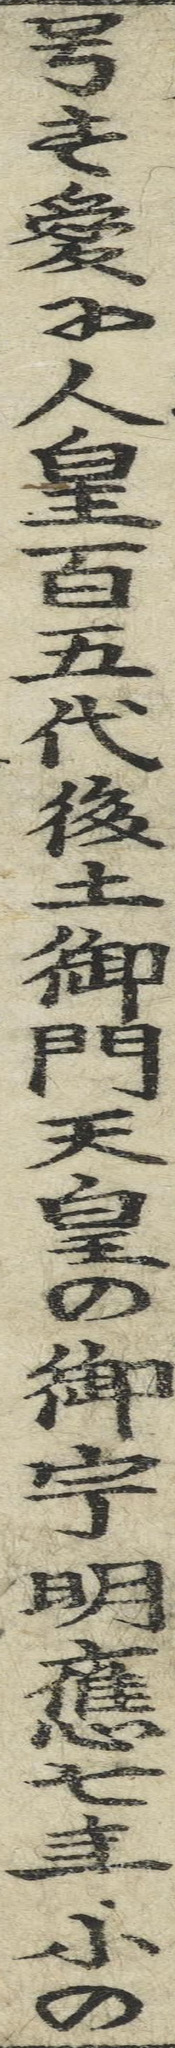号す愛に人皇百五代後土御門天皇の御宇明應七年小の
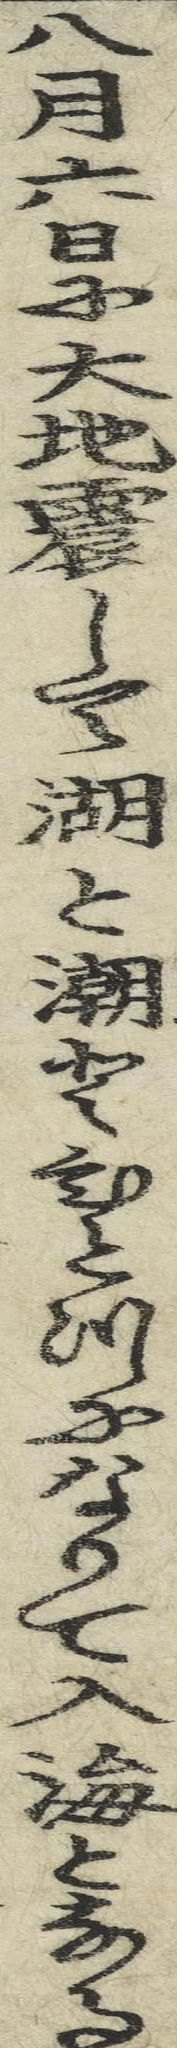八月六日に大地震して湖と潮とひとつになりて入海となる
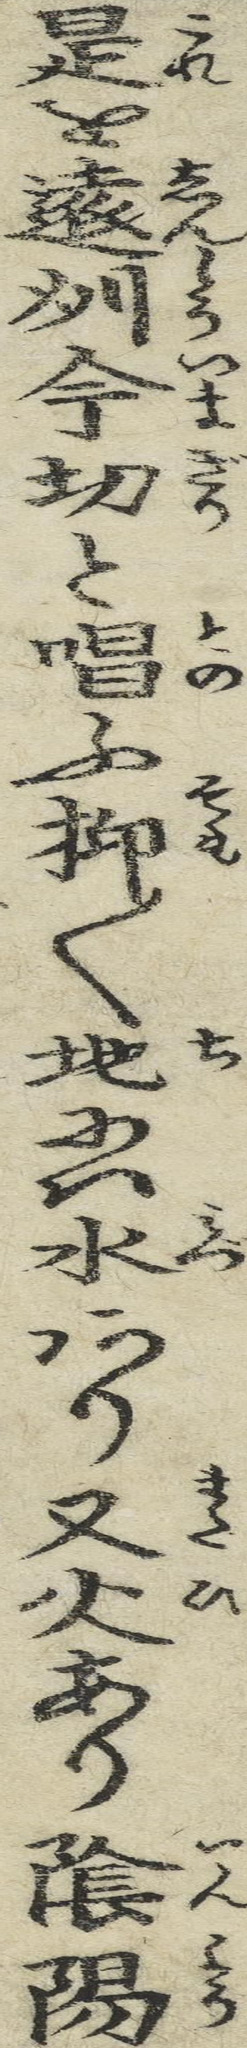是を遠州今切と唱ふ抑〳〵地には水あり又火あり陰陽
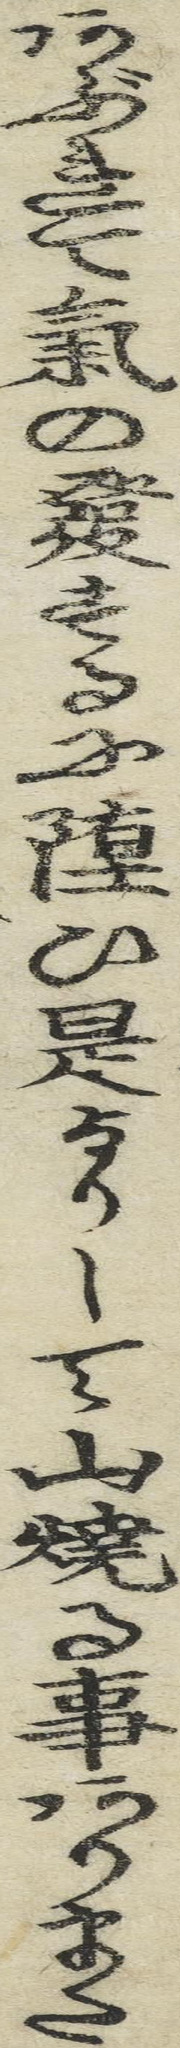あぶれて気の發するに堕ひ是よりして山焼る事ありまた
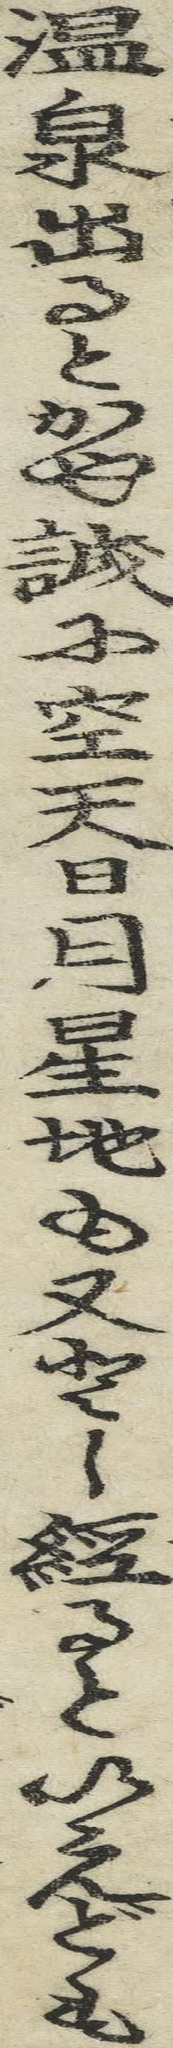温泉出るとかや誠に空天日月星地も又とし経るといえども
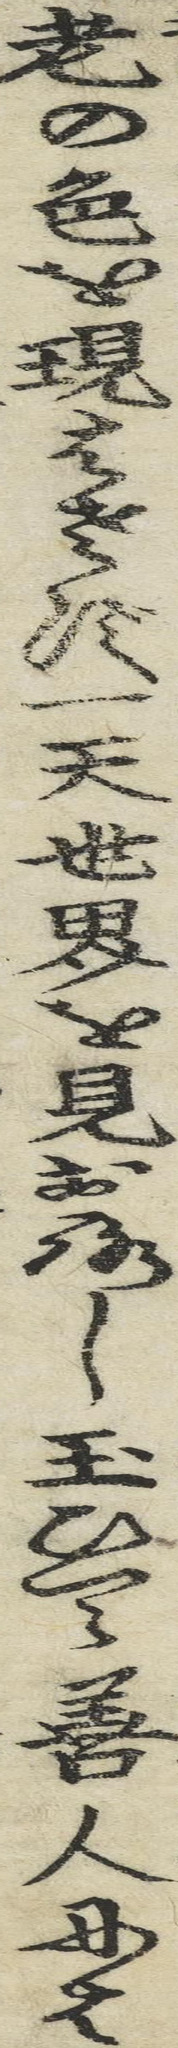老の色を現はさず一天世界を見おろし玉ひて善人には
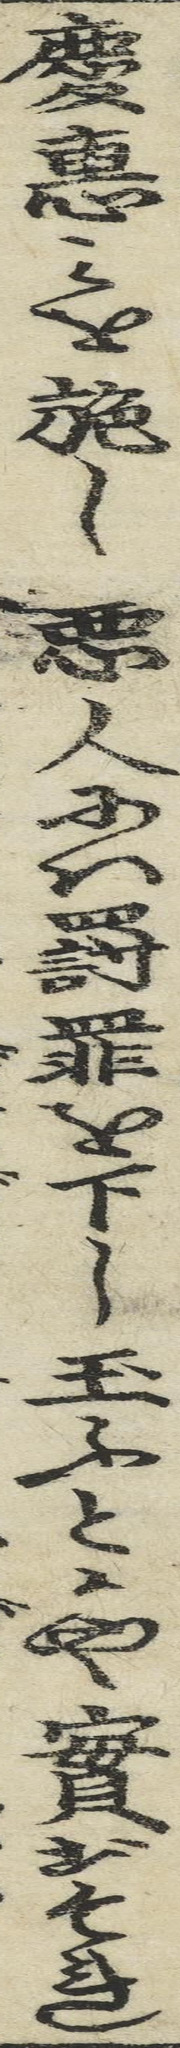慶恵みを施し悪人には罰罪を下し玉ふとかや實おそれ
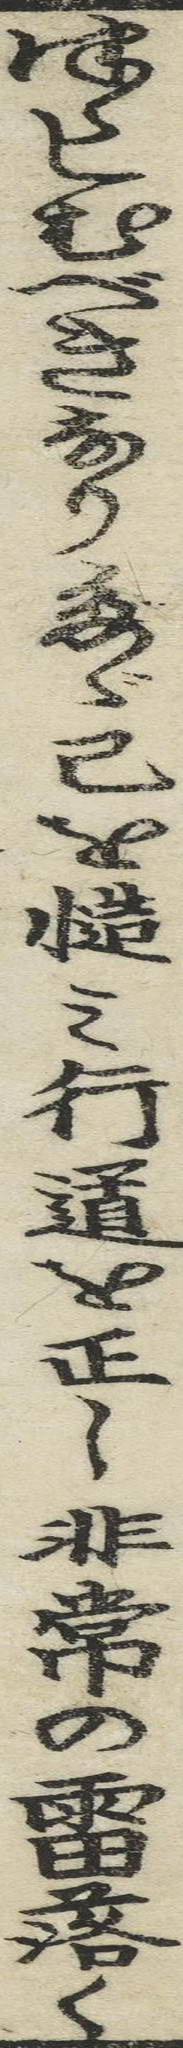つゝしむべきなりたゞ己を慥み行道を正し非常の雷落く
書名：非常日用記
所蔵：東京大学地震研究所図書室 Earthquake Research Institute Library, The University of Tokyo, JAPAN
